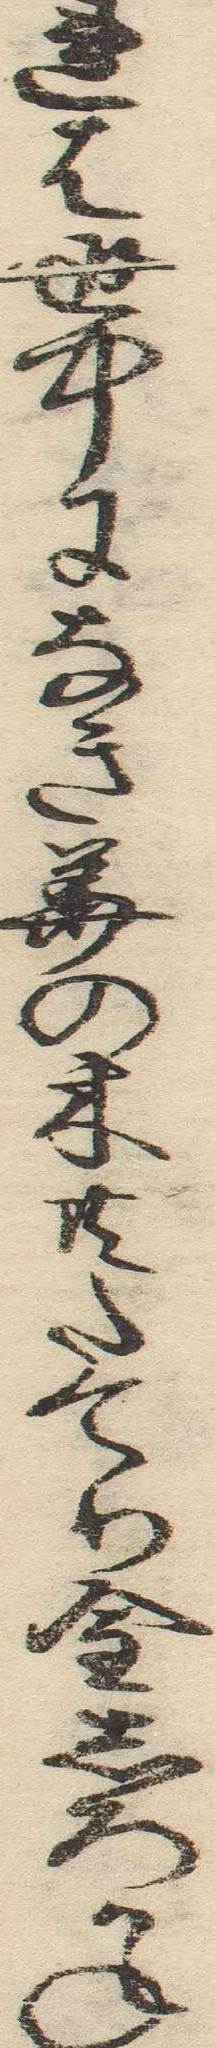れは世中になき華の木共たてり金しろかね

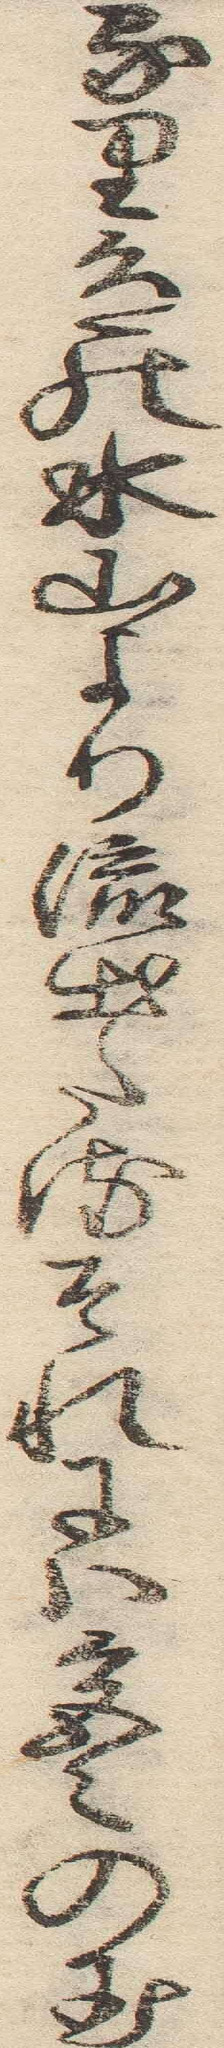るり色の水山より流出たるそれには色々の玉
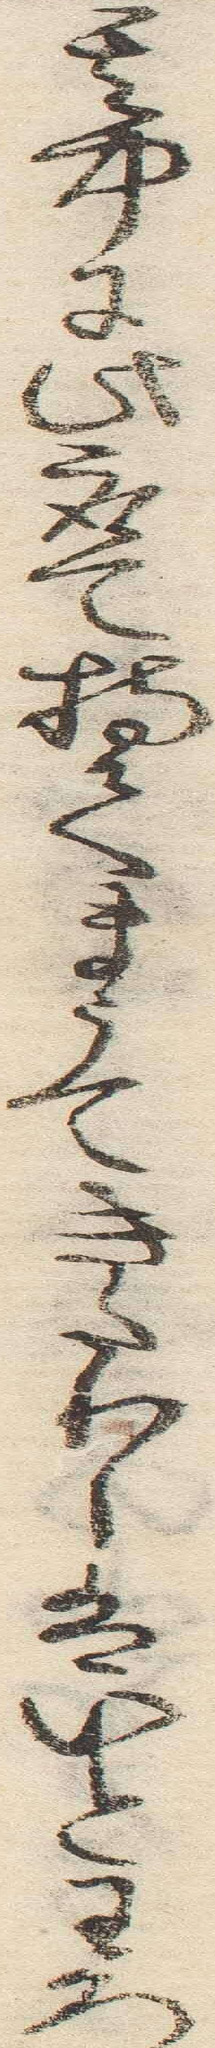其中に此取て持てまうてきたりしはいとわろ
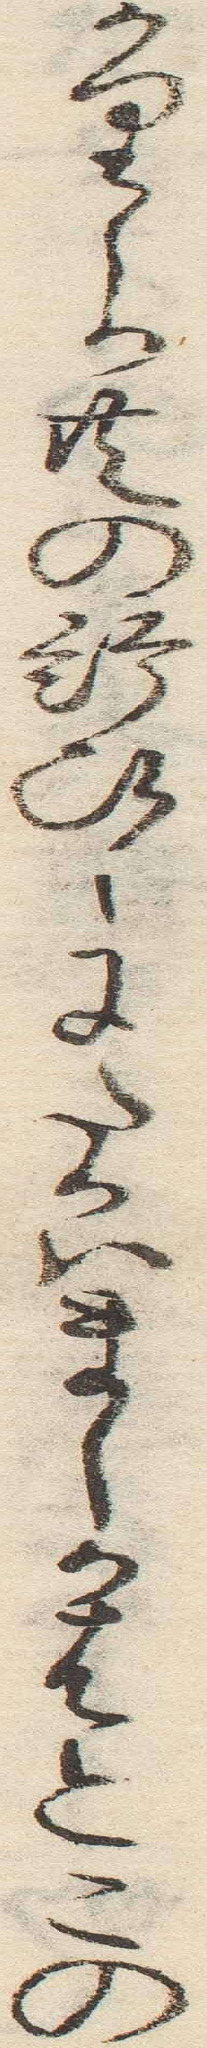かりしか共の給ひしにたかいましかはとこの
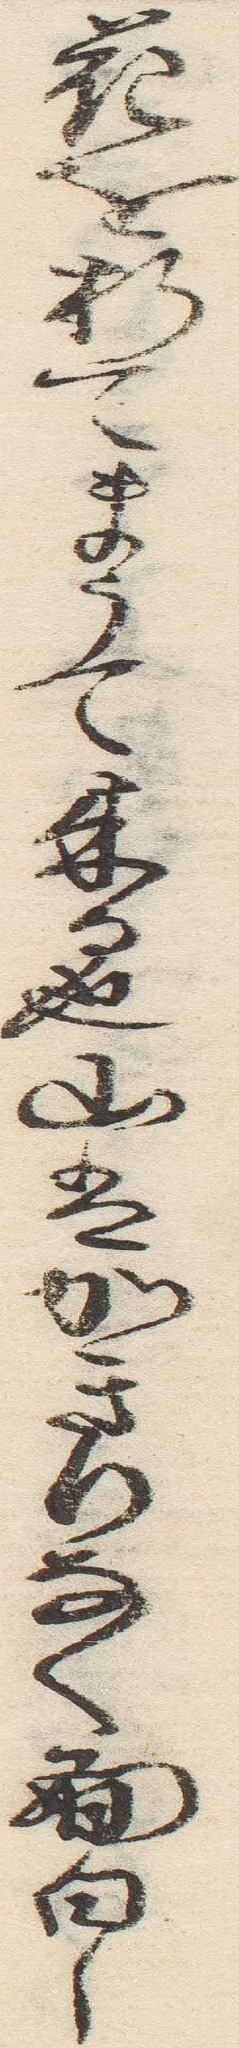花を折てまうて来る也山はかきりなく面白し
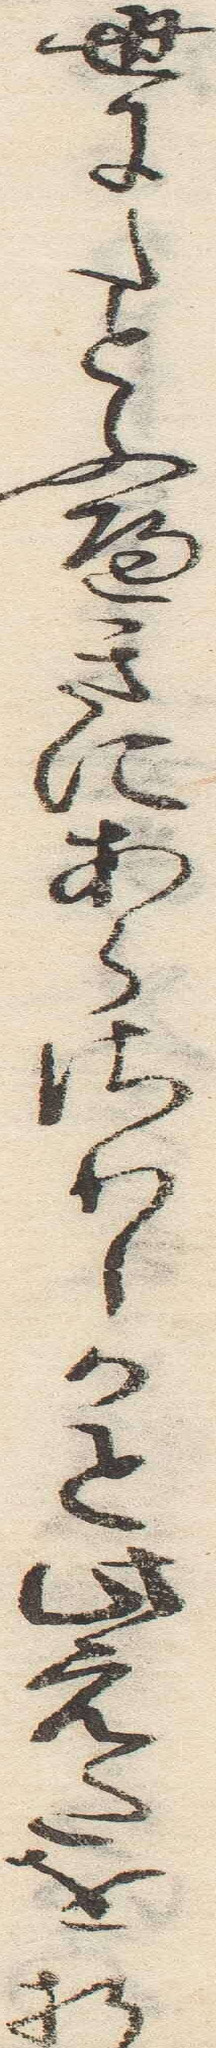世にたとふへきにあらさりしかと此えたを折
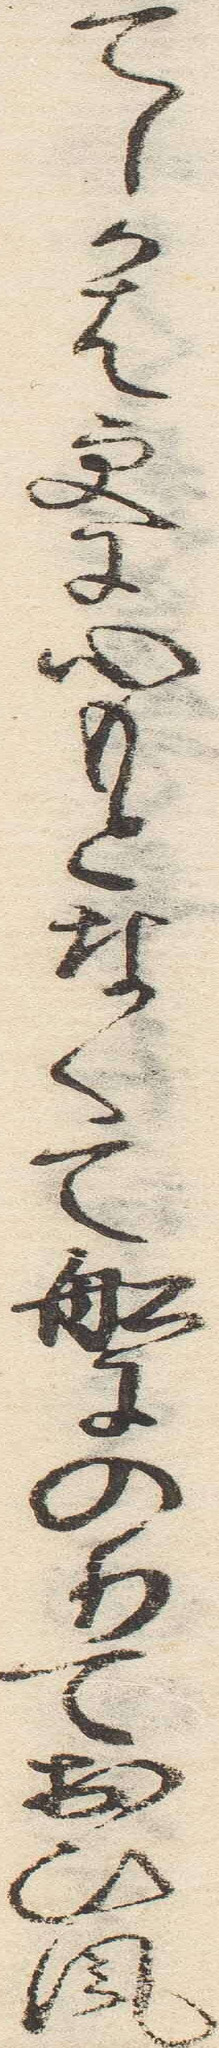てしかは更に心もとなくて船にのりておひ風
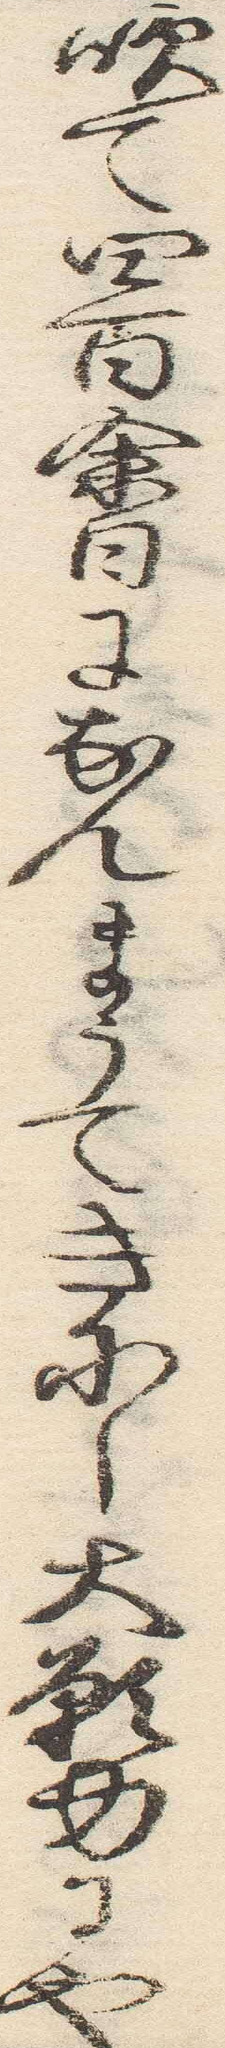吹て四百余日になんまうてきにし大願力にや
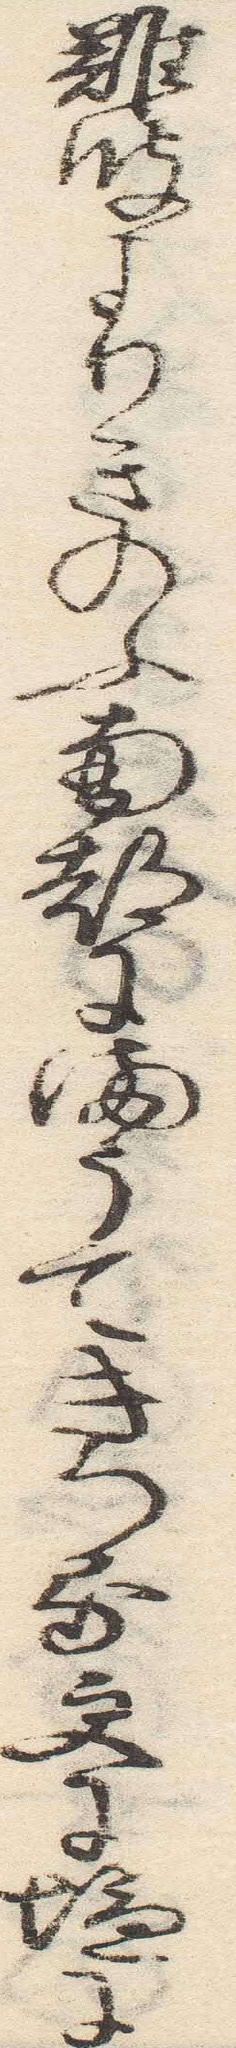難波よりきのふ南都にまうてきつる更に塩に
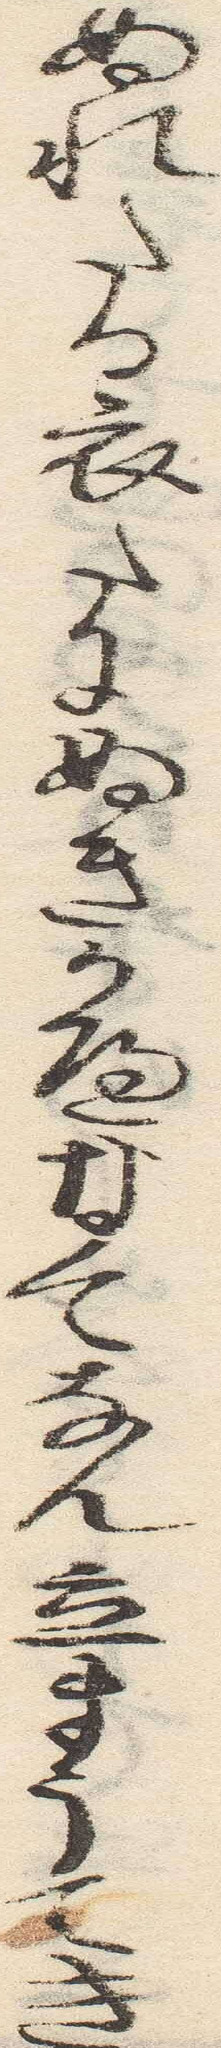ぬれたる衣たにぬきかへなてなん立まうてき
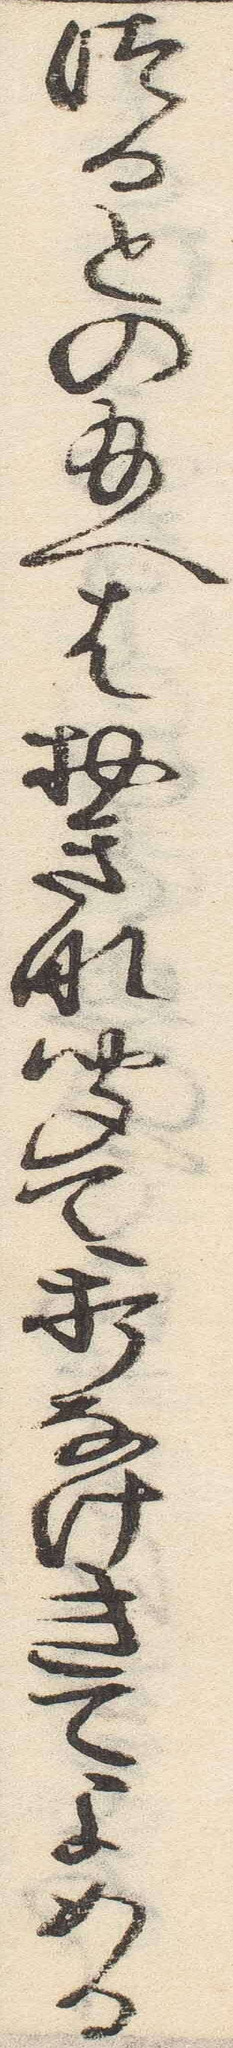つるとの給へはおきな聞て打なけきてよめる
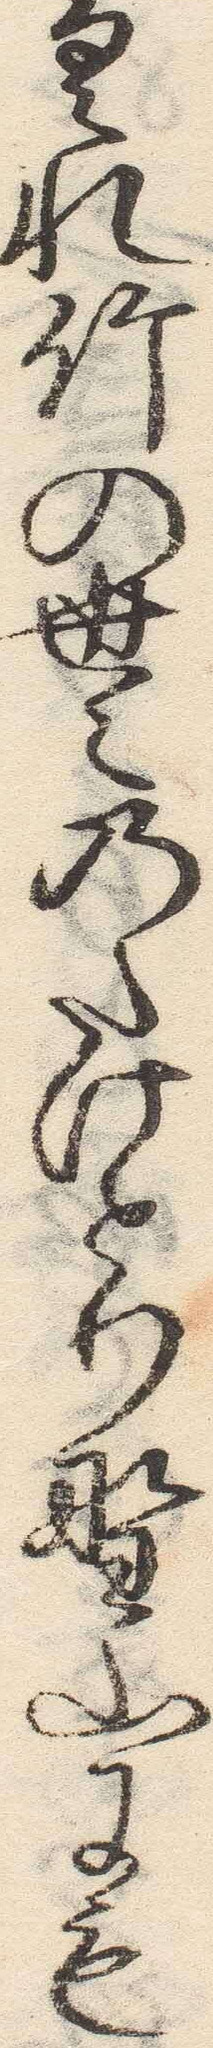くれ竹の世々のたけとり野山にも
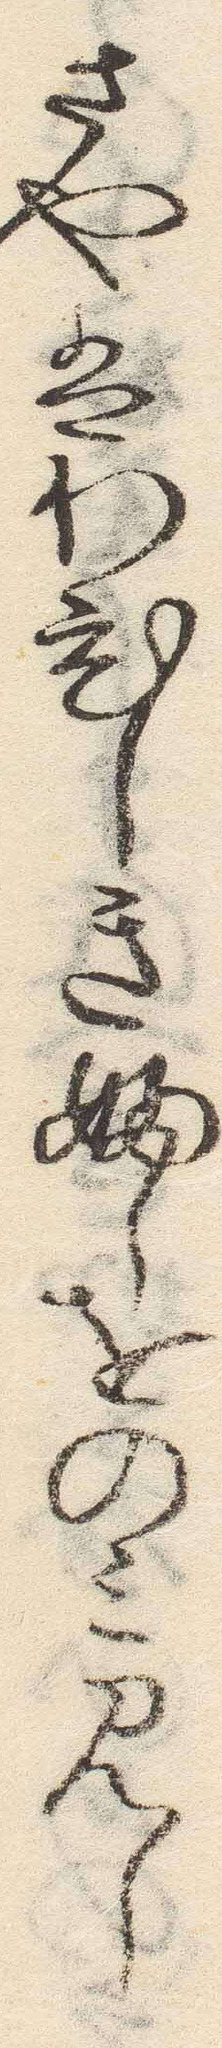さやはわひしきふしをのみ見し
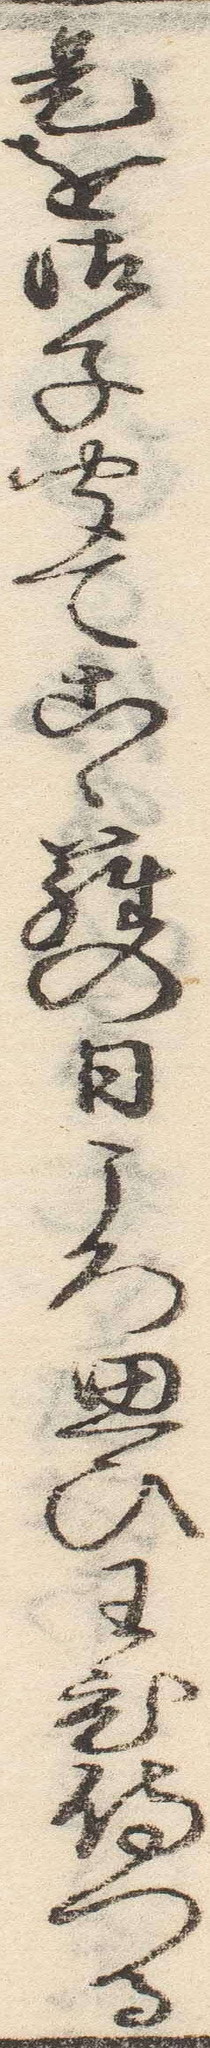是を御子聞てこゝらの日ころ思ひにひ侍つる
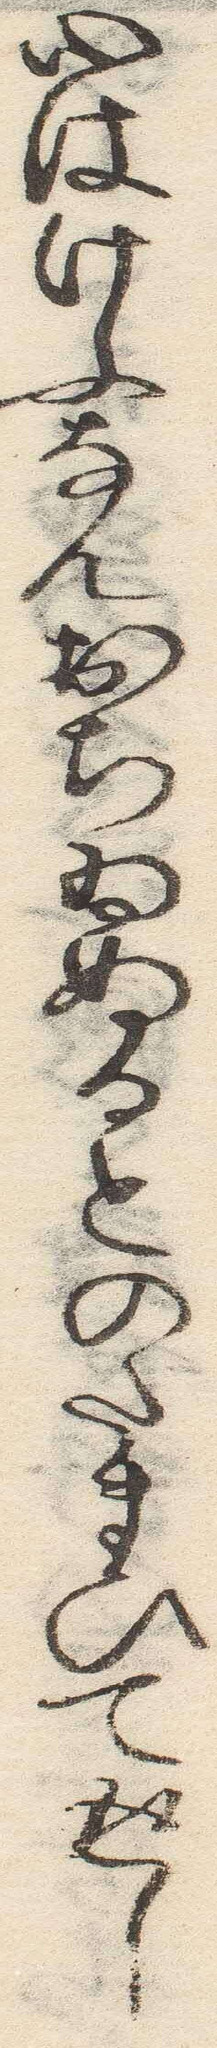心はけふなんおちゐめるとのたまひて返し
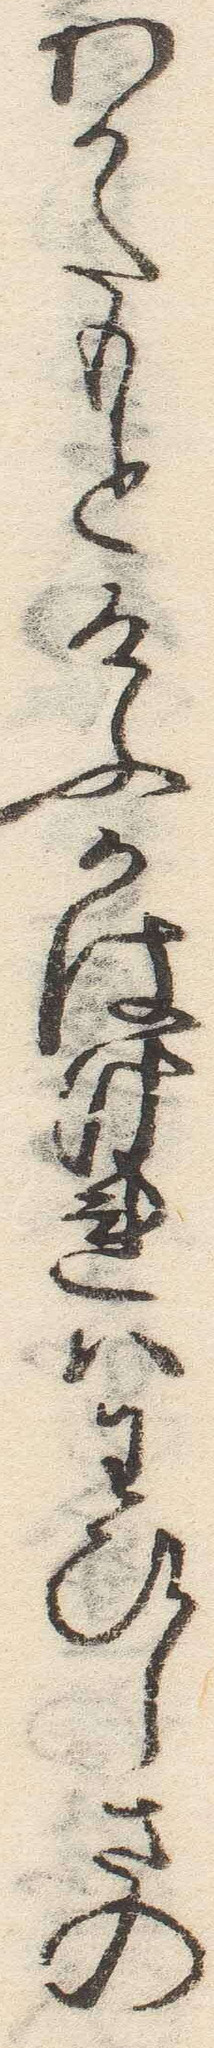わかたもとけふかはけれはわひしさの
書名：竹取物語
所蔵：東京学芸大学附属図書館 国文学研究資料館
